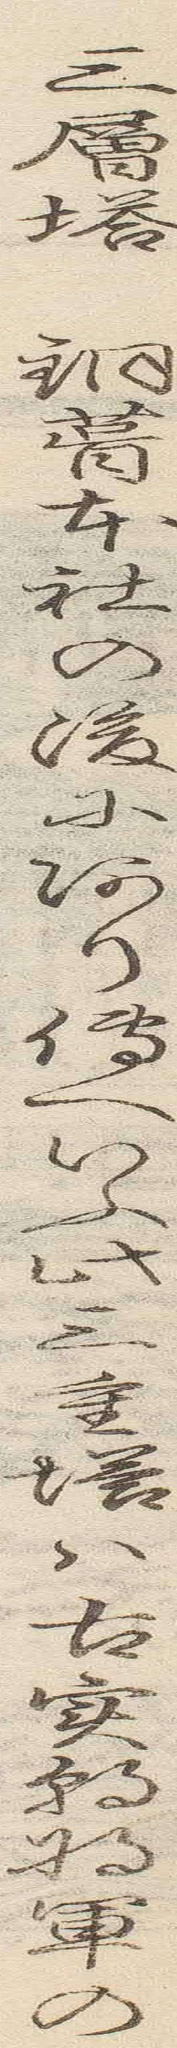三層塔銅葺本社の後にあり傳へいふ此三重塔は古実朝将軍の
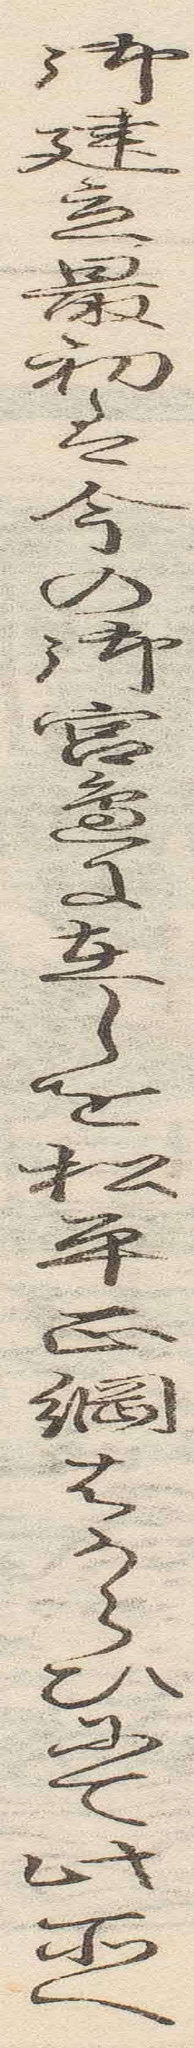御建立最初は今の御宮邊に在しを松平正綱はからひにて此所へ
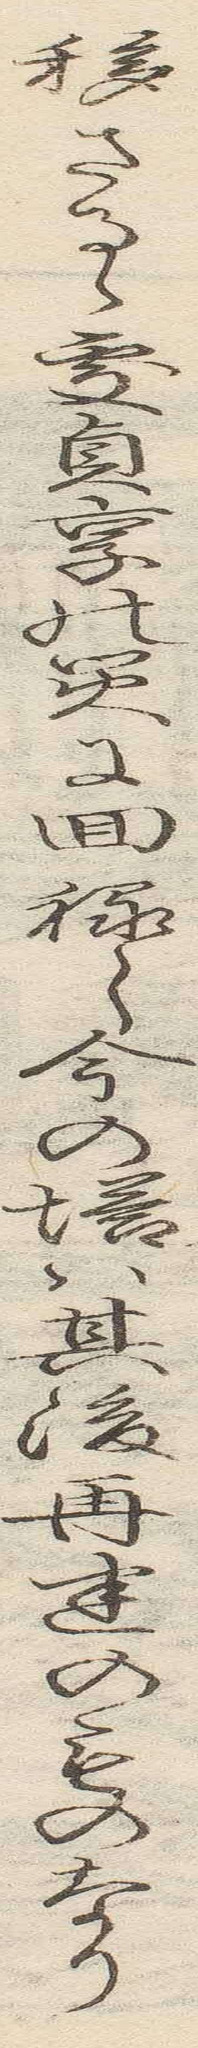移さるゝ處貞享の災に囬禄し今の塔は其後再建のものなり
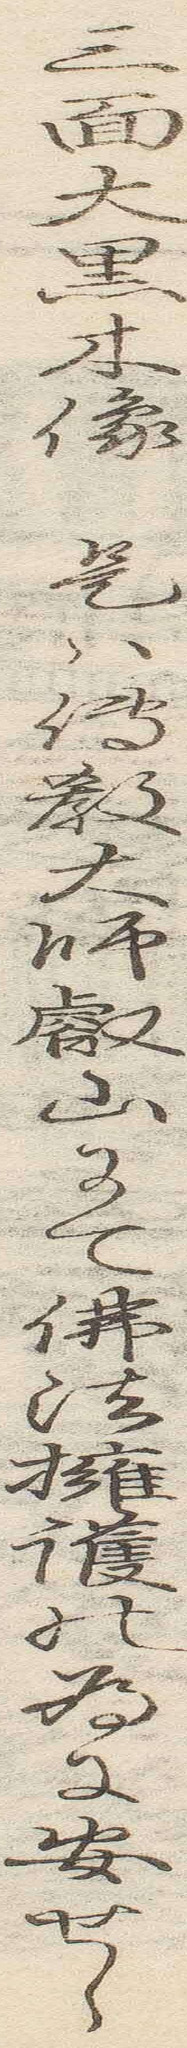三面大黒木像是は傳敎大師叡山にて佛法擁護の為に安せし
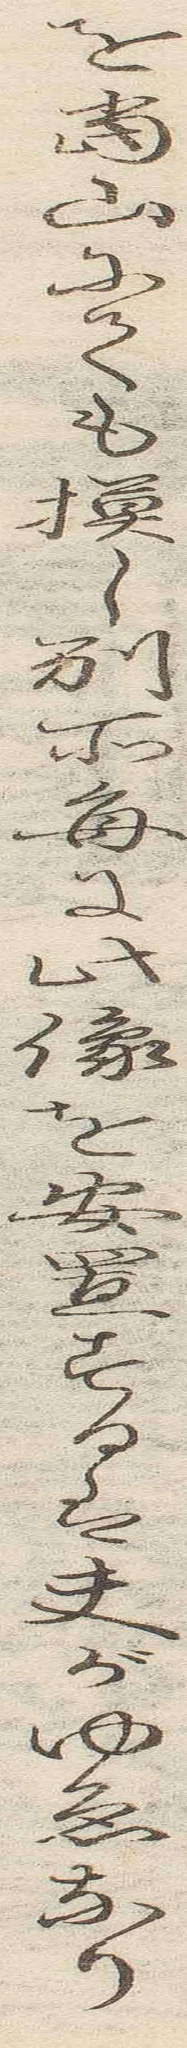を當山にても摸し別所每に此像を安置するは夫がゆゑなり
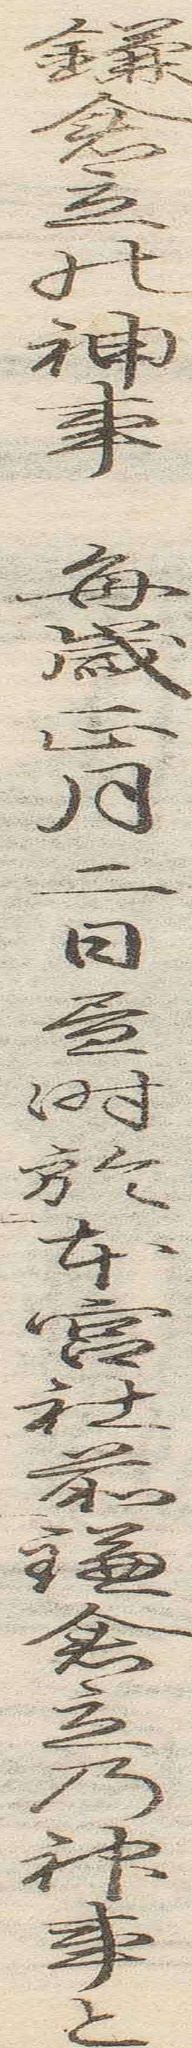鎌倉立の神事每歳正月二日昼时於本宮社前鎌倉立の神事と
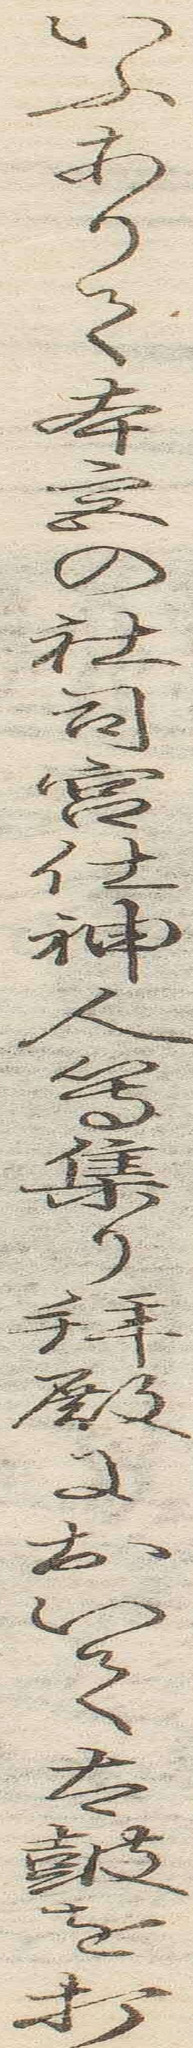いふありて本宮の社司宮仕神人等集り拜殿において太鼓を打
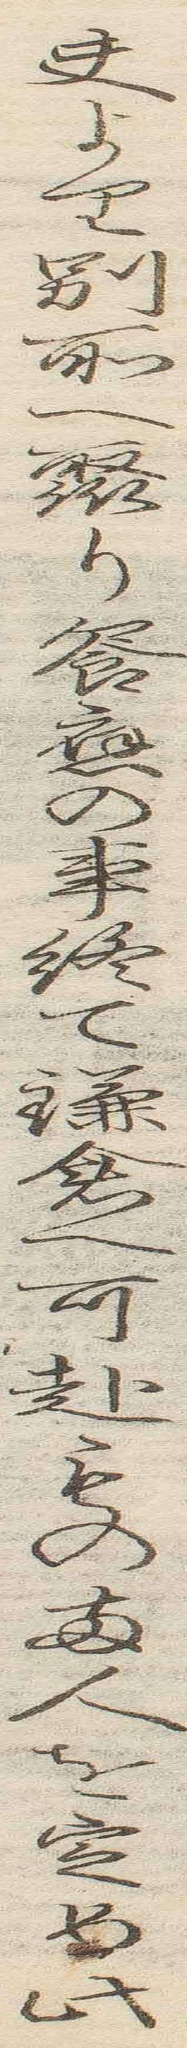夫より別所へ聚り饗應の事終て鎌倉へ可赴もの両人を定め此
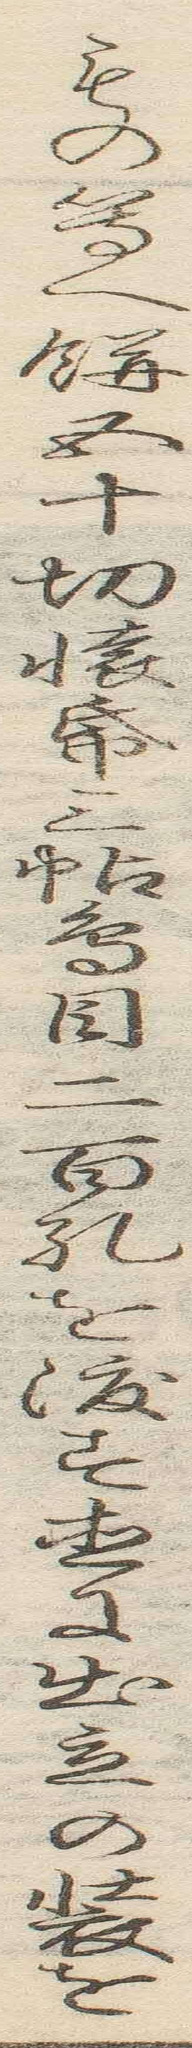もの等へ餅五十切懐帋三帖鳥目二百孔を渡す直に出立の装を
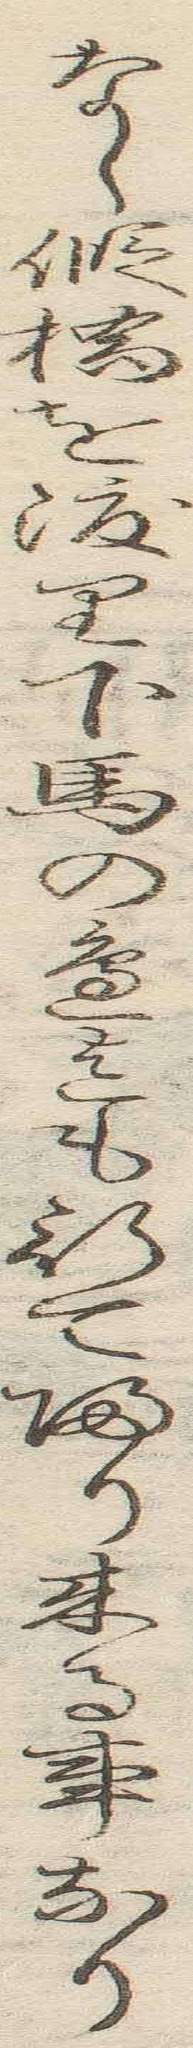なし假橋を渡り下馬の邊迄も行て帰り来る事なり
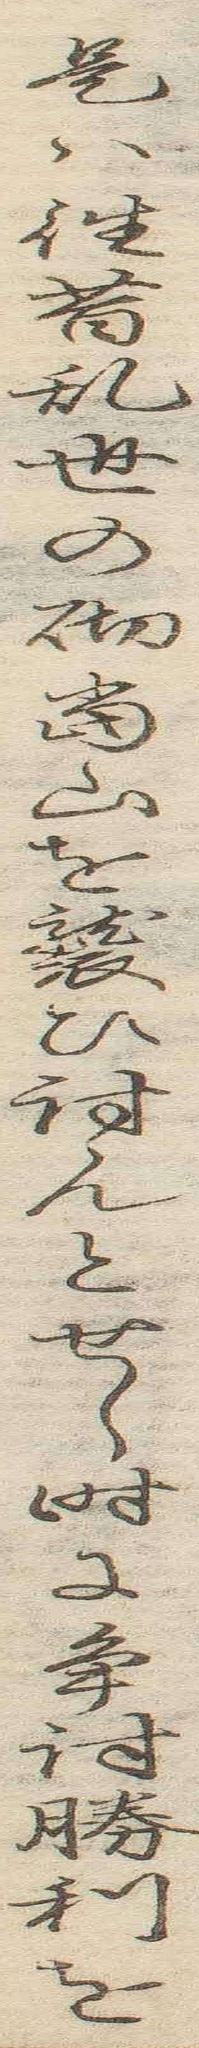是は徃昔乱世の砌當山を襲ひ討んとせし时に争討勝利を
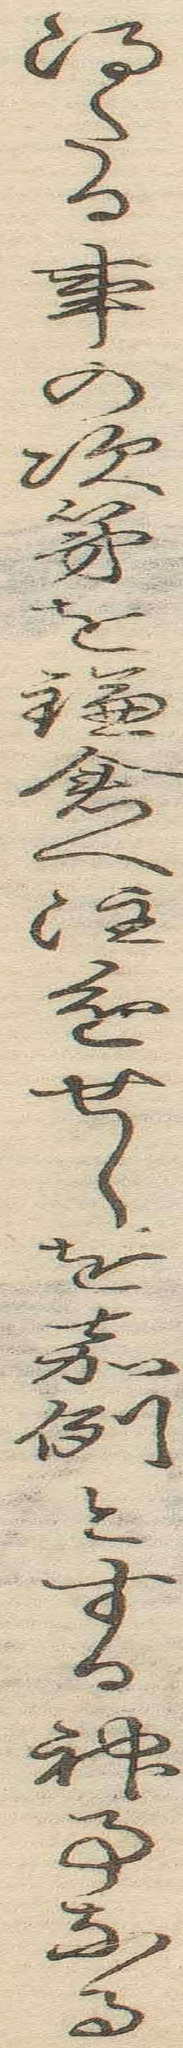得たる事の次第を鎌倉へ注進せしを嘉例とする神事なる

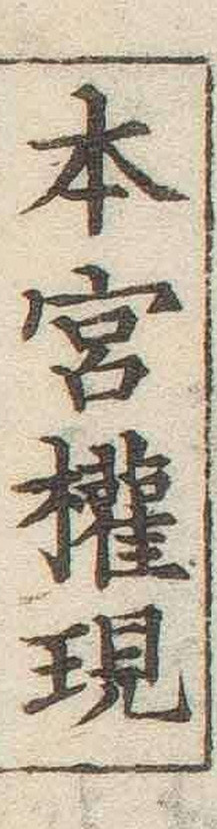本宮權現
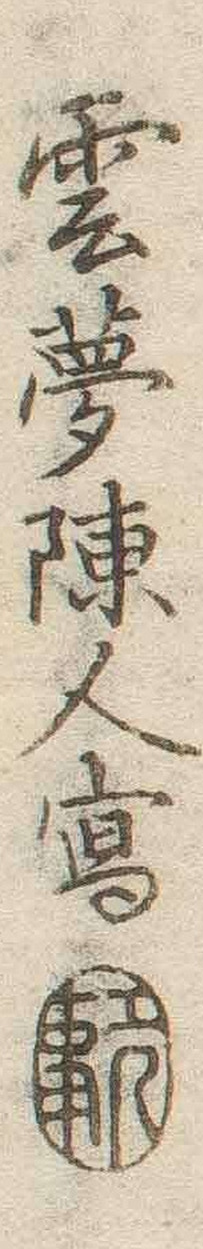雲夢陳人寫

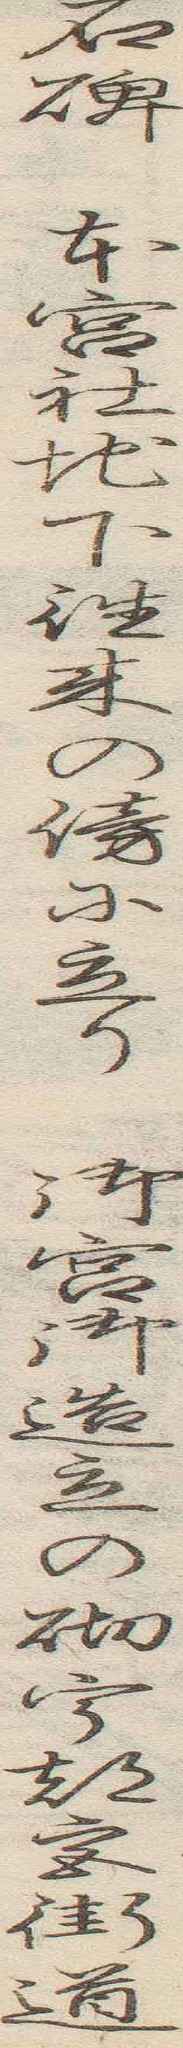石碑本宮社地下徃来の傍に立り御宮御造立の砌宇都宮街道
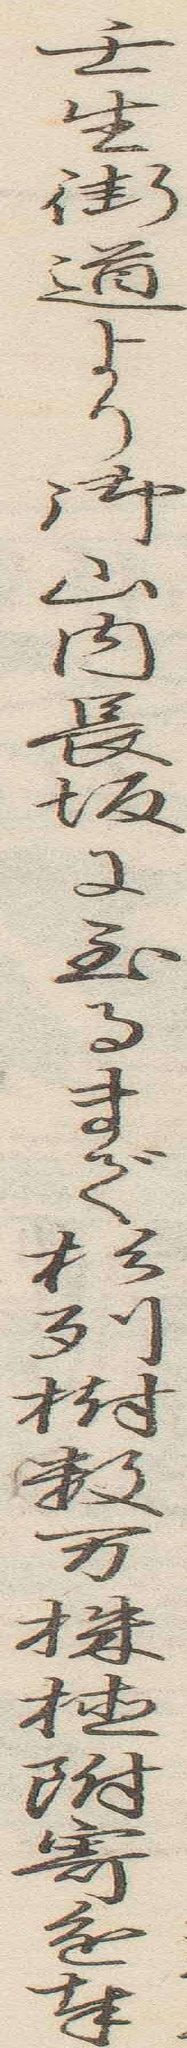壬生街道より御山内長坂に至るまで杉列樹数万株植附寄進奉
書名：日光山志
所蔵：東京学芸大学附属図書館 国文学研究資料館
